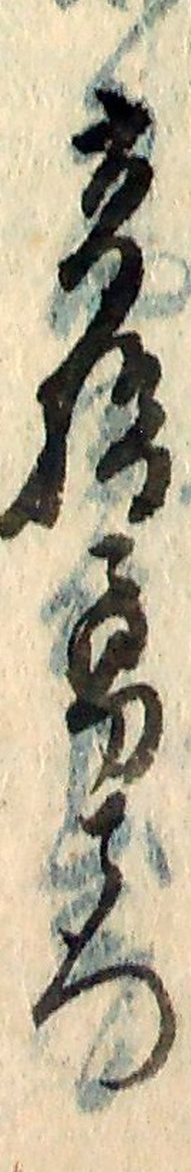高橋勇右衛門
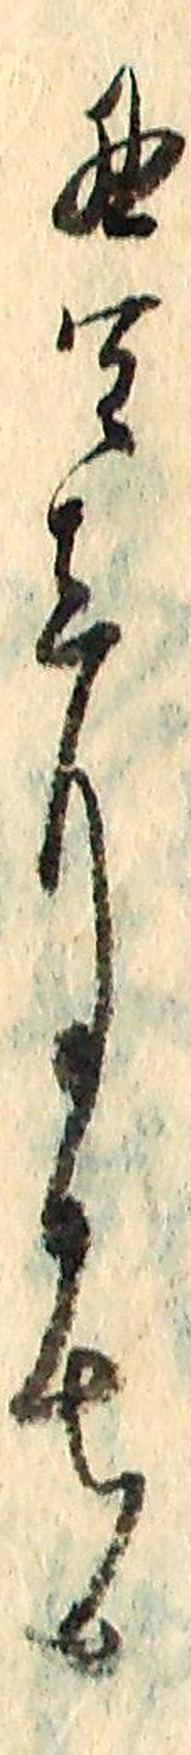丑閏十二月十七日
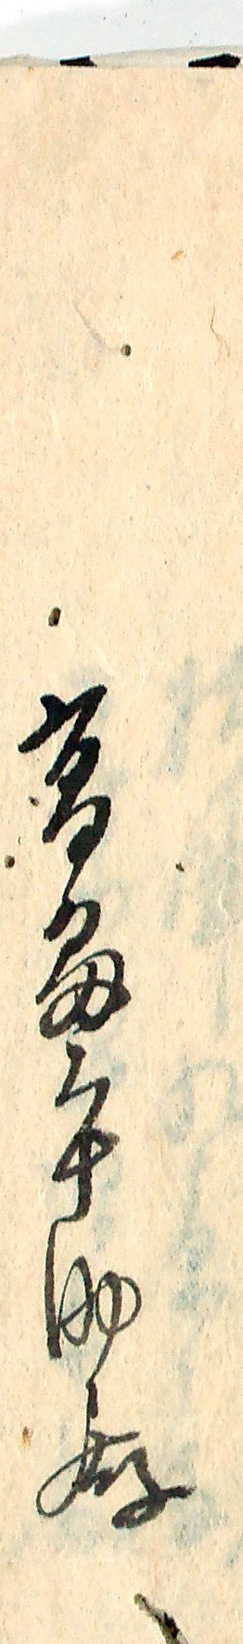高畠平助殿
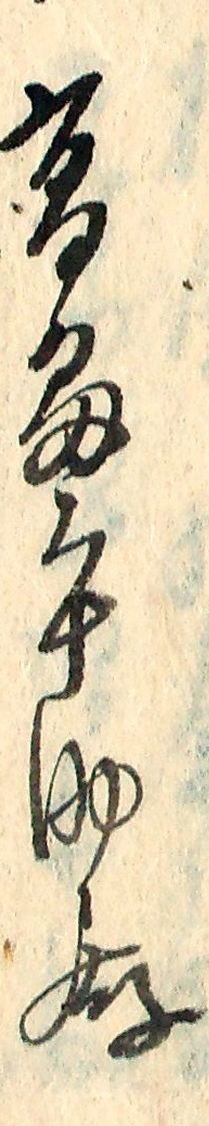高畠平助殿

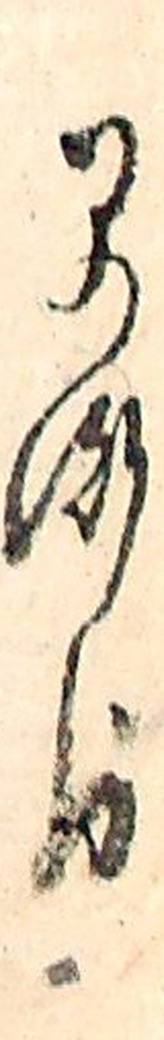早淵村
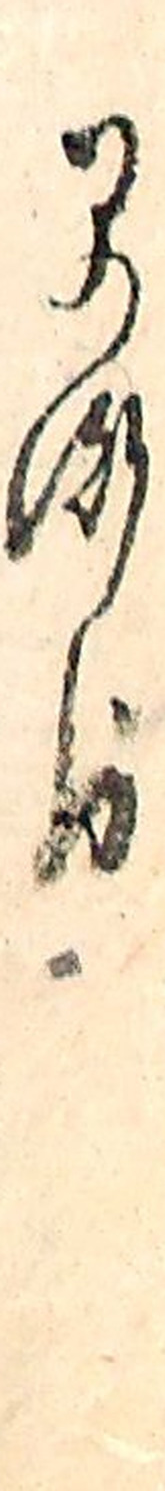早淵村
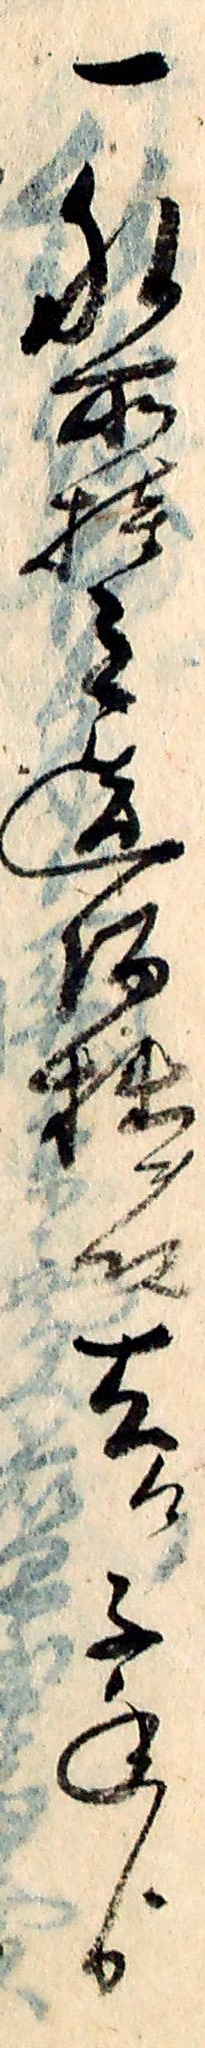一私所持之造酒株を以去る子年ゟ
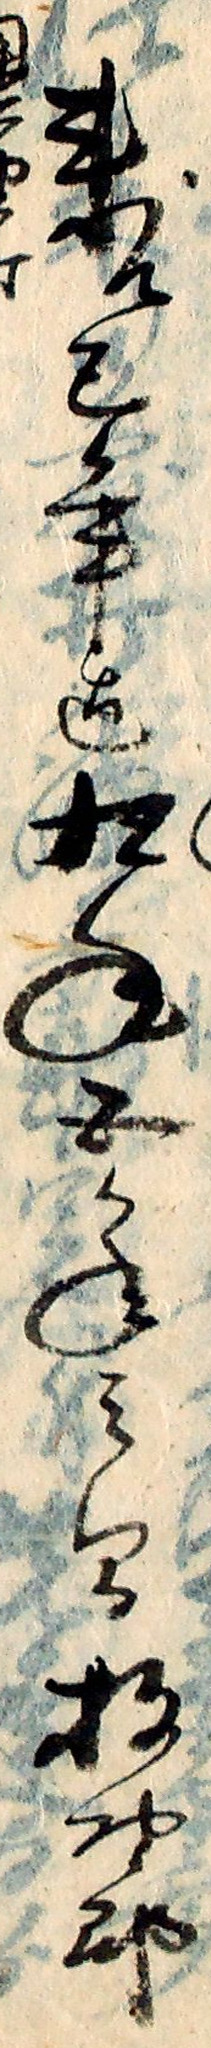来る巳年迄丸年五ヶ年之間板野郡
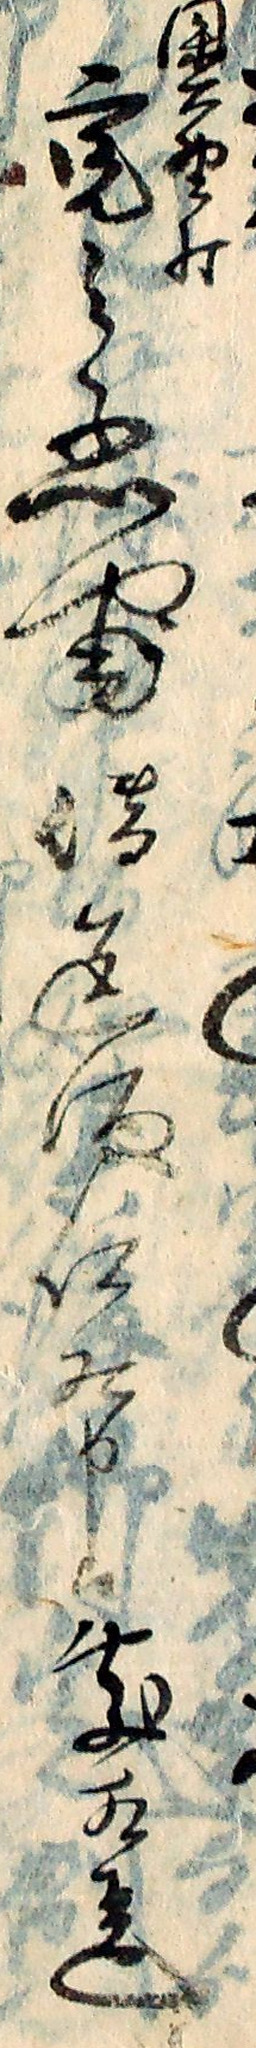奥野村虎之丞宅借造酒仕居申候処相違
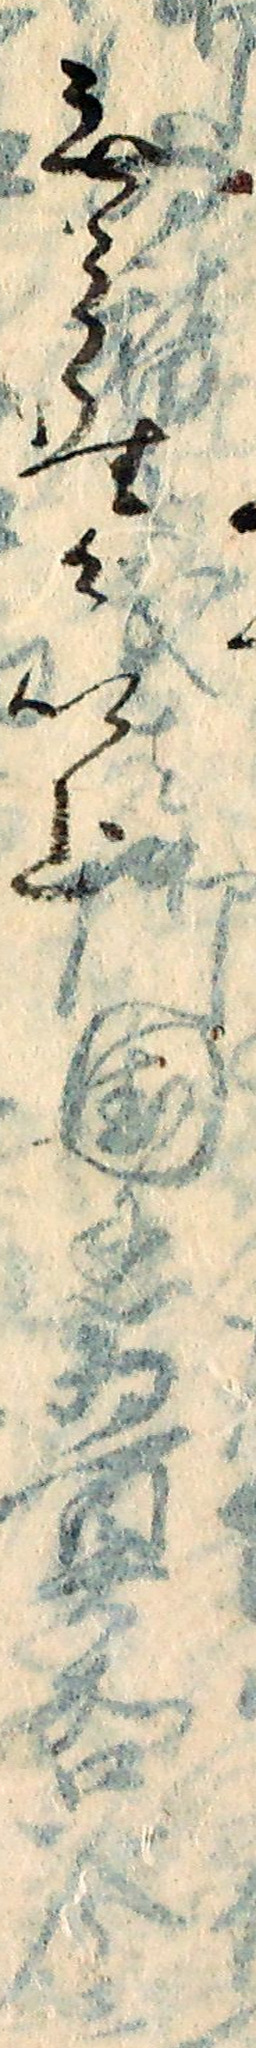無御座候以上
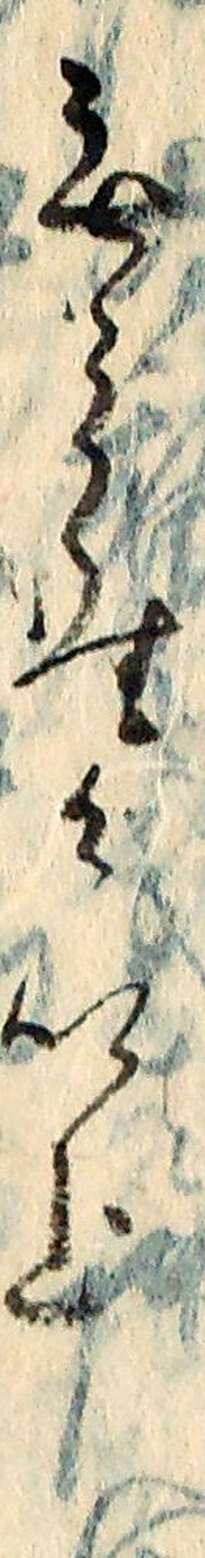無御座候以上
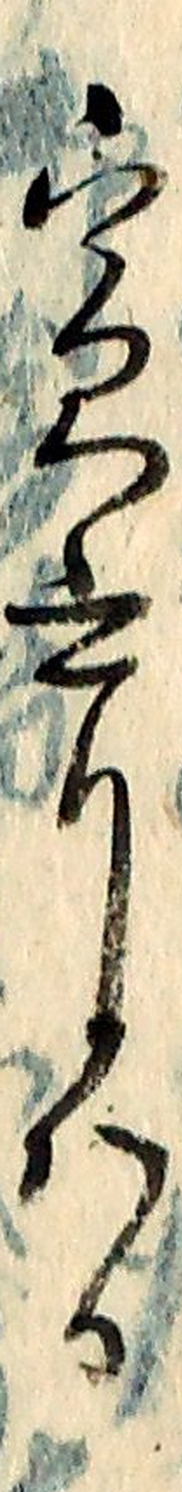寅六月八日
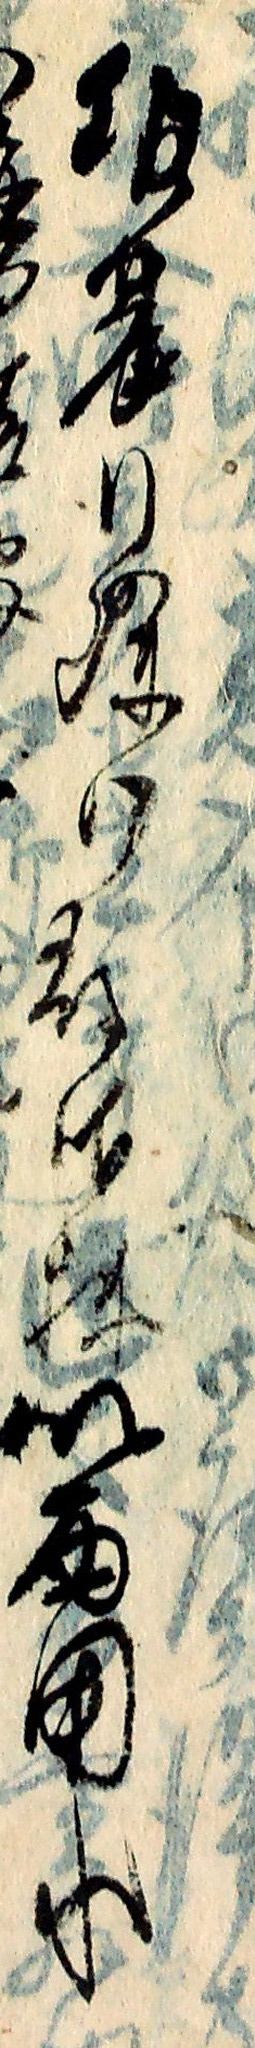勧農引除御郡代様以西用水
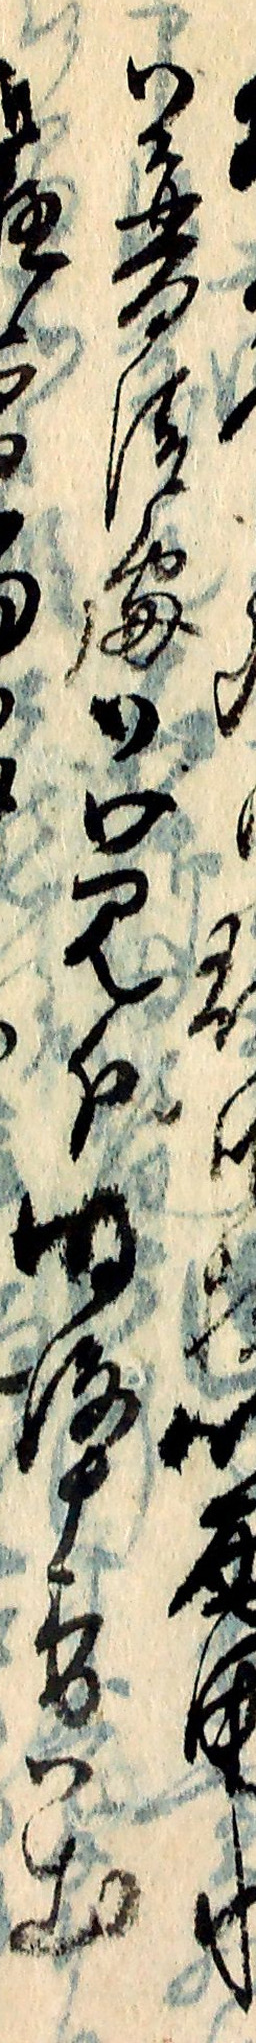御普請処御御見分明後十三日御出
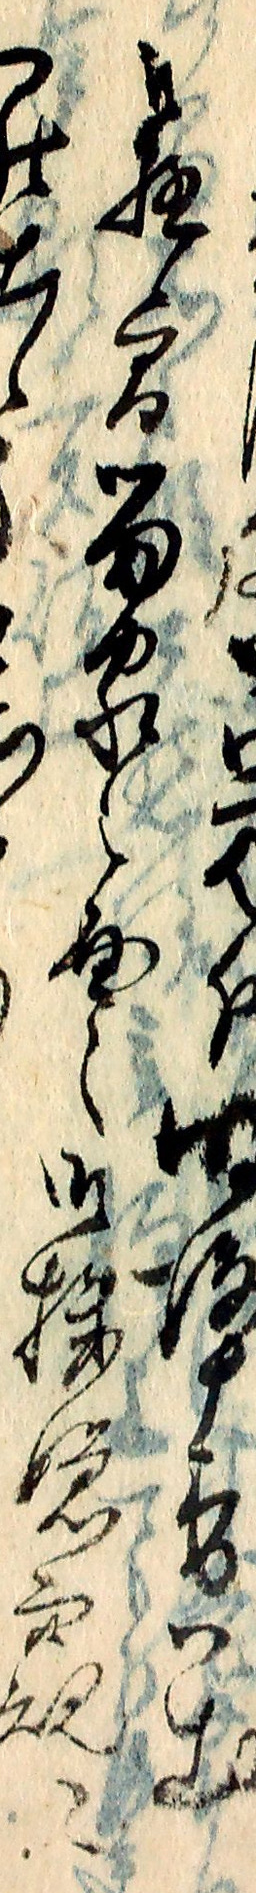被遊候間留家之面々御機嫌窺に
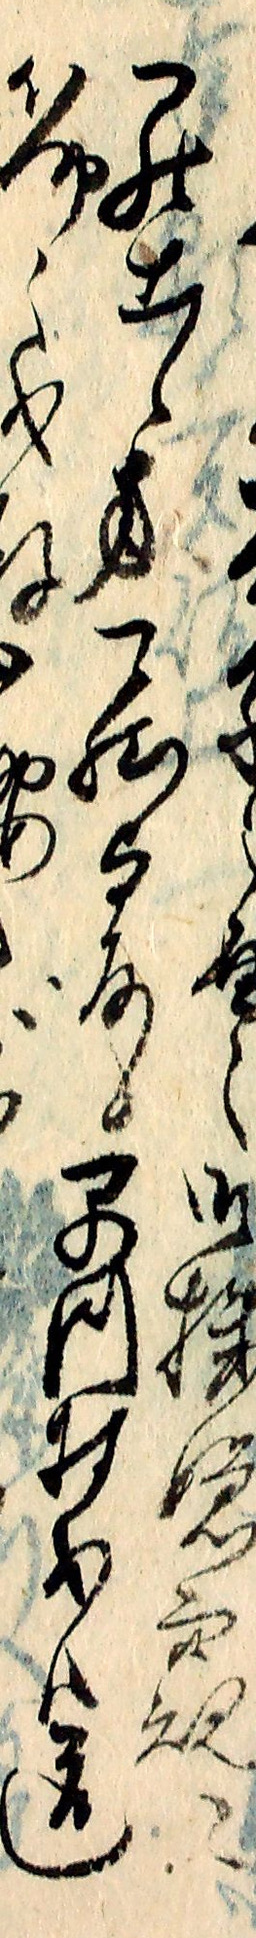罷出候方可然と存候早淵村義は道
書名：諸御願書控(後藤氏壱番）
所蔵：鳴門教育大学 Naruto University of Education
